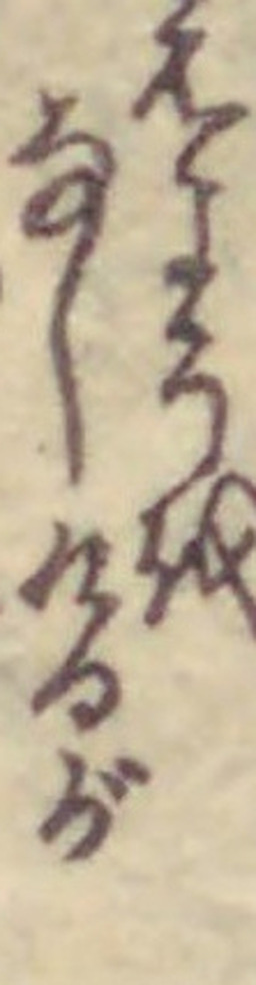なしけるが
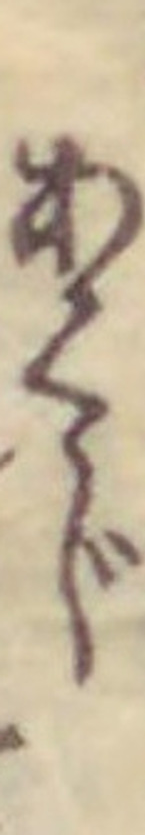あくじ
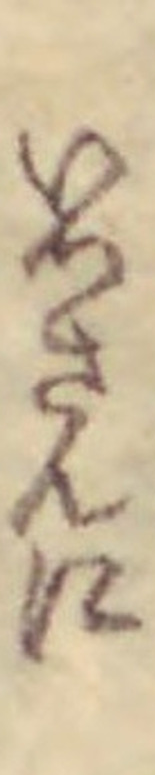いつさんに
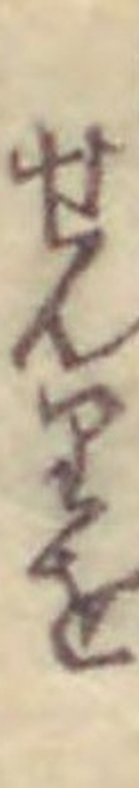せんりを
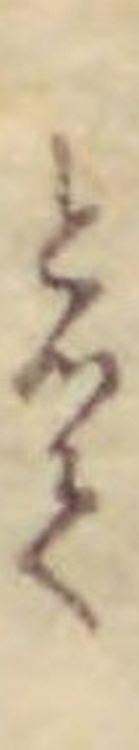とつて
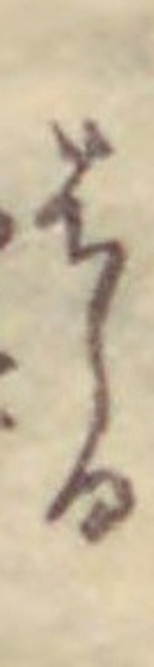はしる
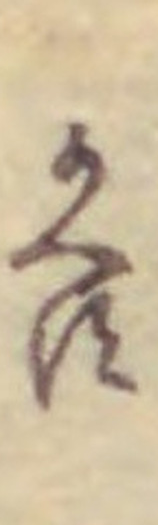かへす
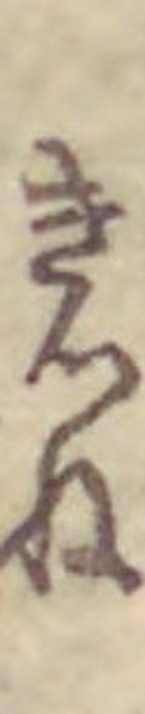きつね
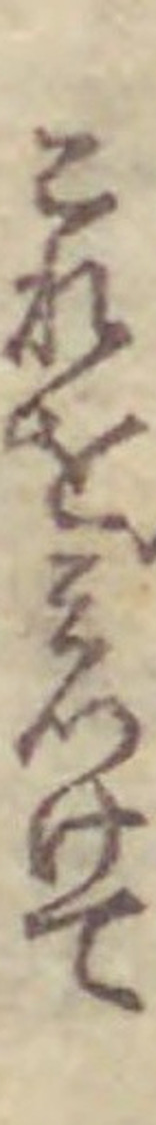これをみつけて
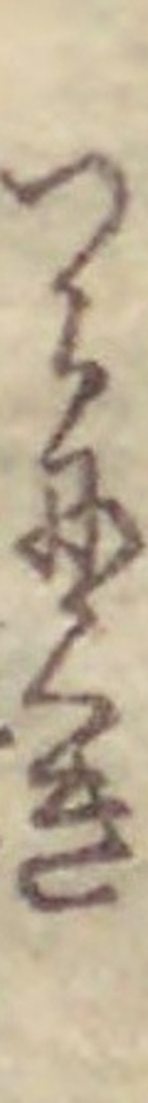つらにくき
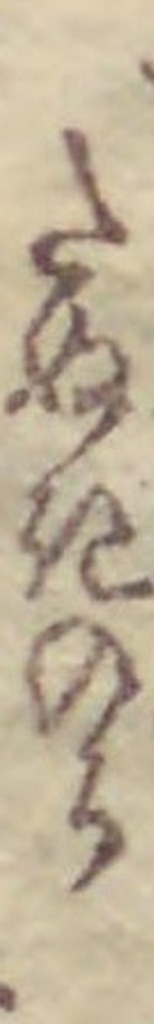たぬきのら
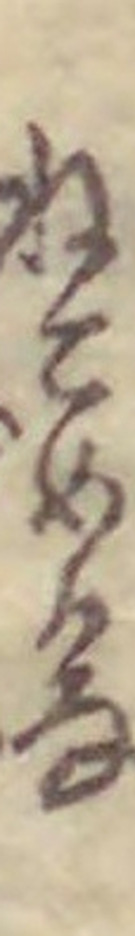ねこめかな
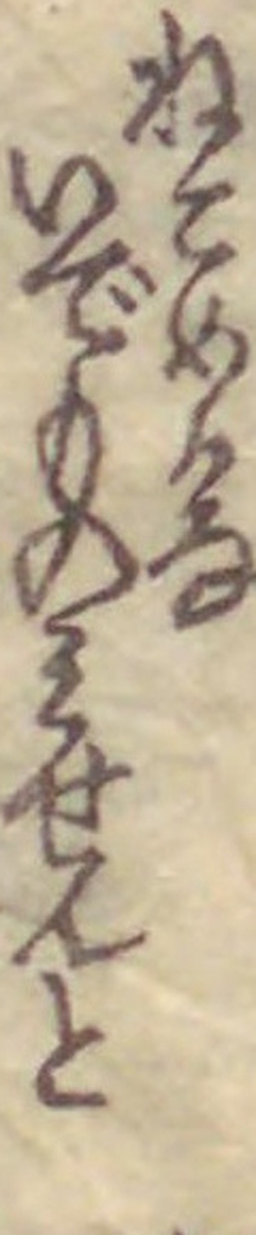いでものみせんと
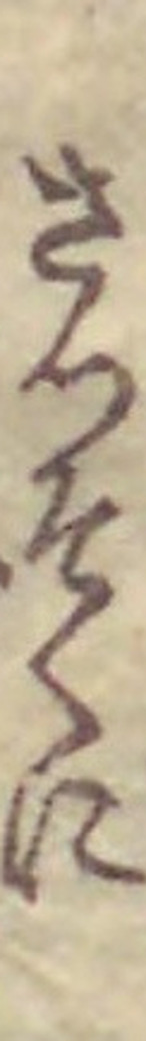さつそくに
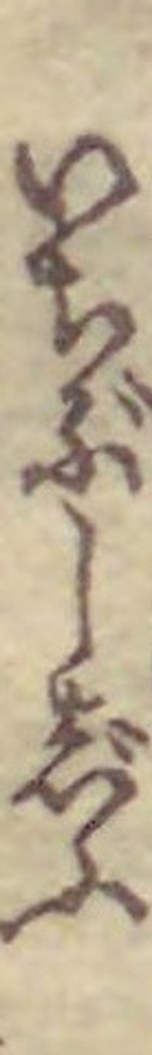いちぶしじふ
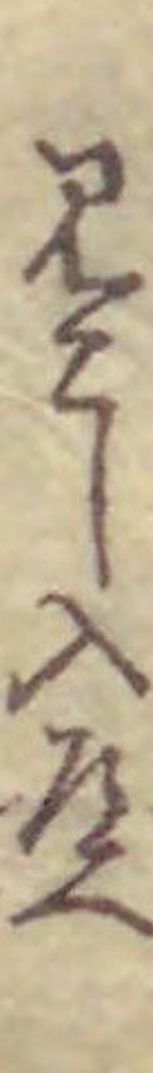みこし入道へ
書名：化物世帯氣質
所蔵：国立国会図書館 National Diet Library, JAPAN
